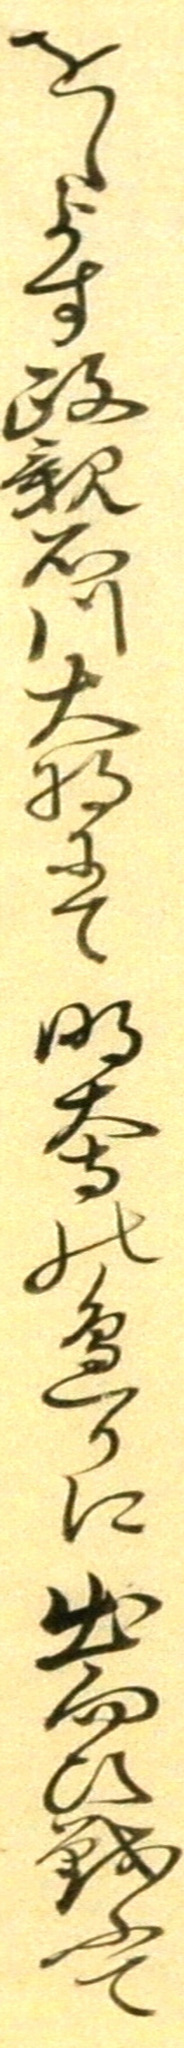をしよす政親石川大将にて明大寺の辺りに出向ひ戦ふて
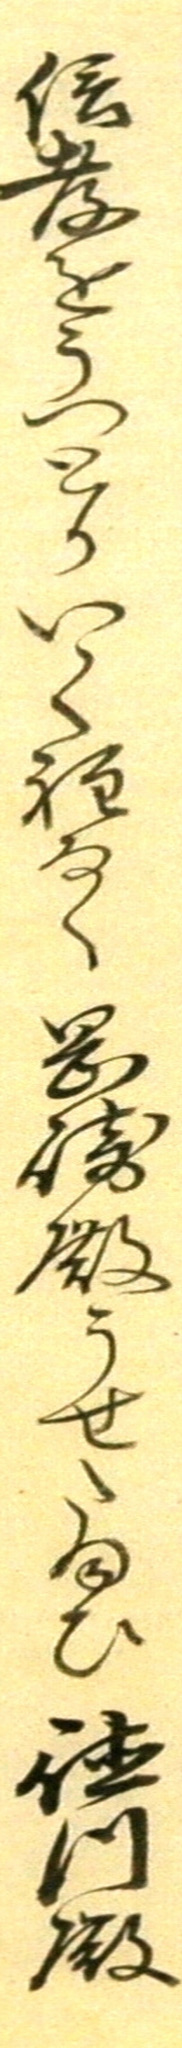信孝をうつとりいく程なく岡崎殿うせたまひ徳川殿
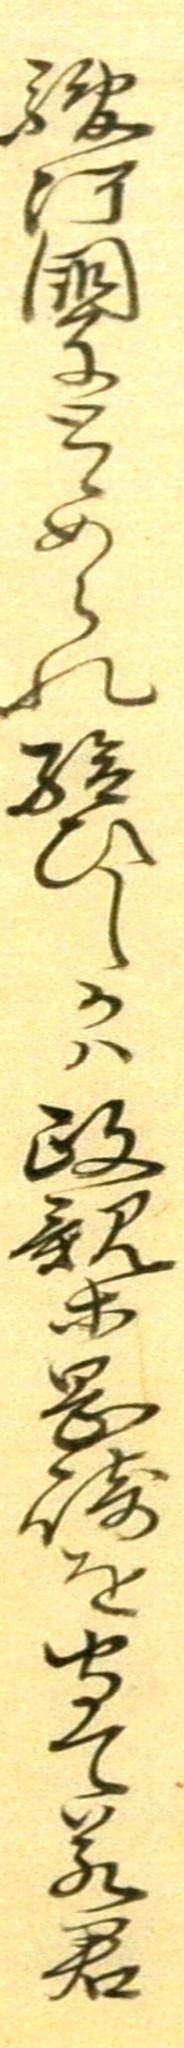駿河国にとゝめられ給ひしかは政親等岡崎を守て若君
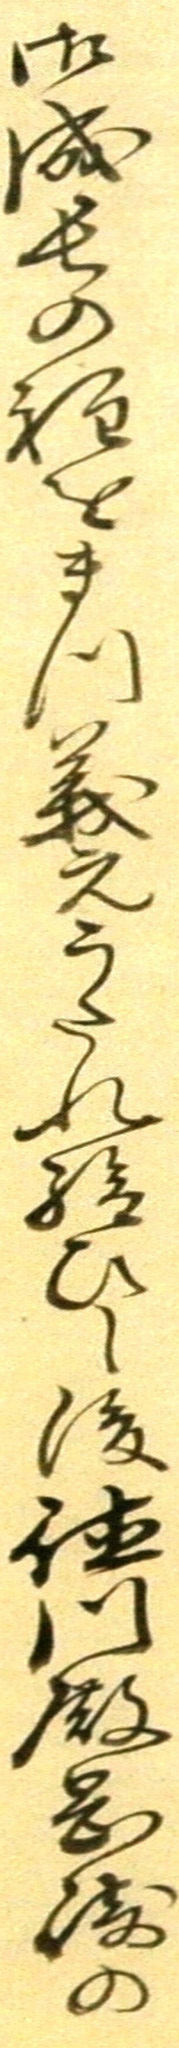御成長の程をまつ義元うたれ給ひし後徳川殿岡崎の
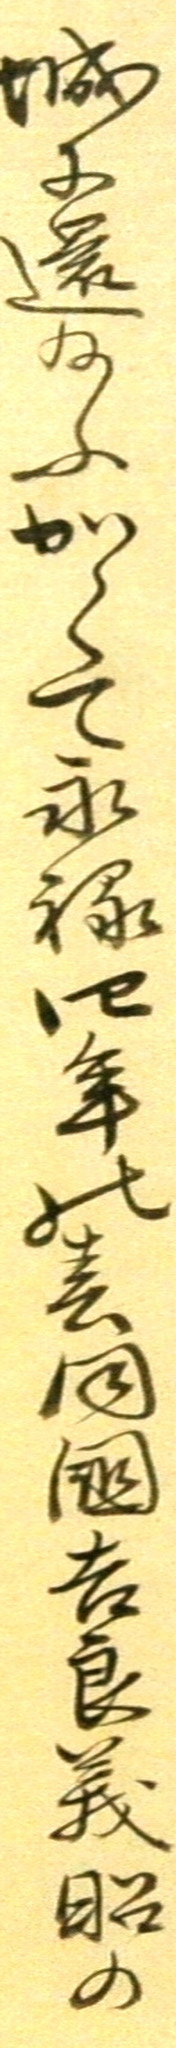城に還給ふかくて永禄四年の春同国吉良義昭の
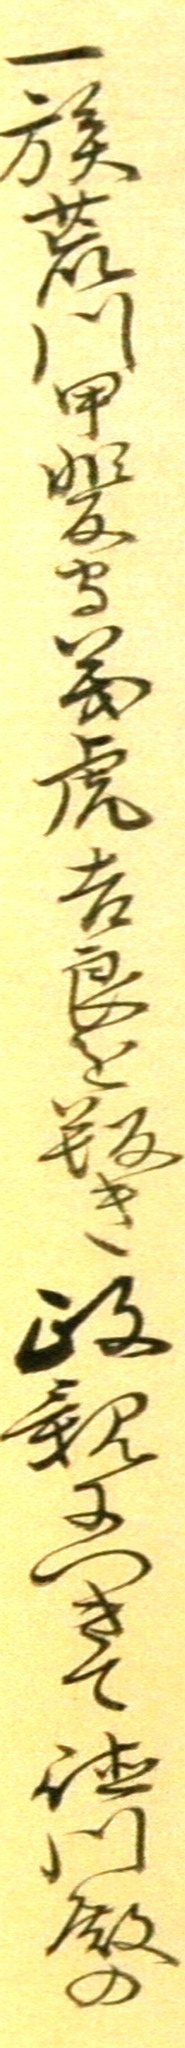一族荒川甲斐守義虎吉良を叛き政親につきて徳川殿の

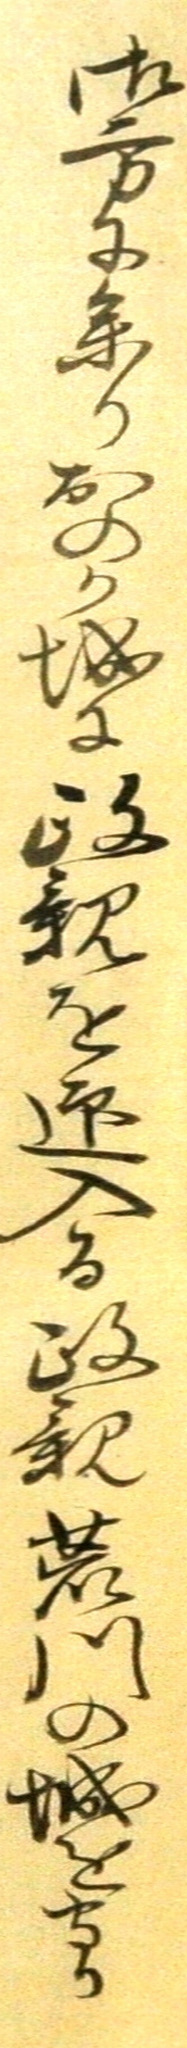御方に参りおのか城に政親を迎入る政親荒川を守り
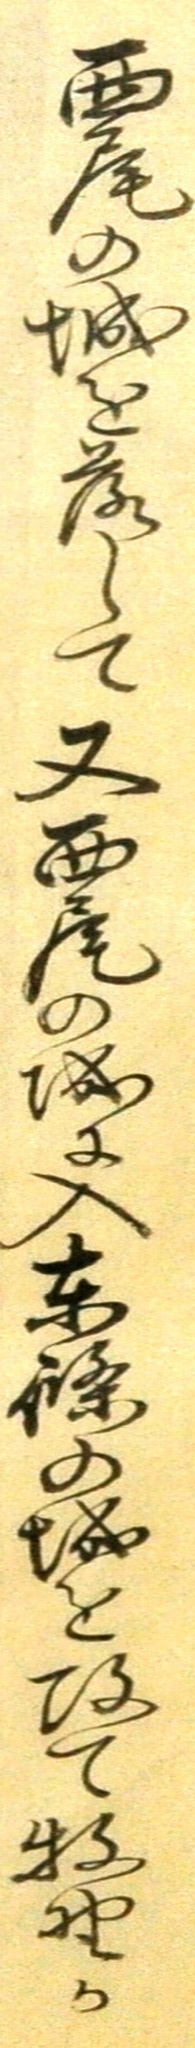西尾の城を落して又西尾の城に入東条の城を攻て牧野か
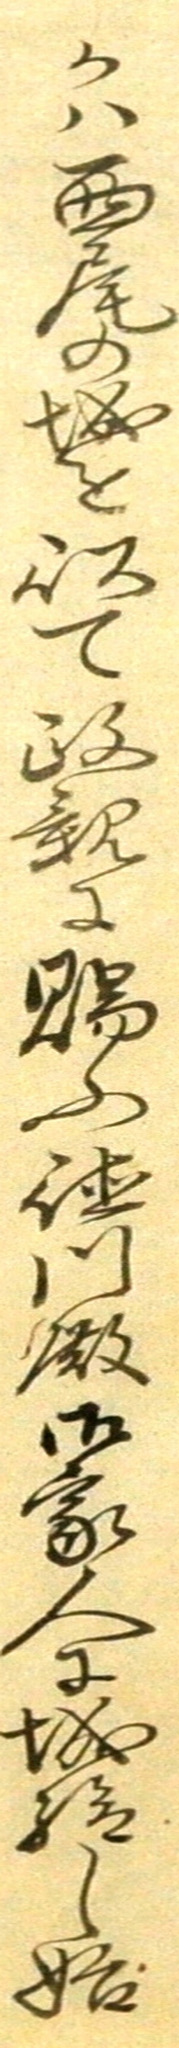かは西尾の城を以て政親に賜ふ徳川殿御家人に城給し始
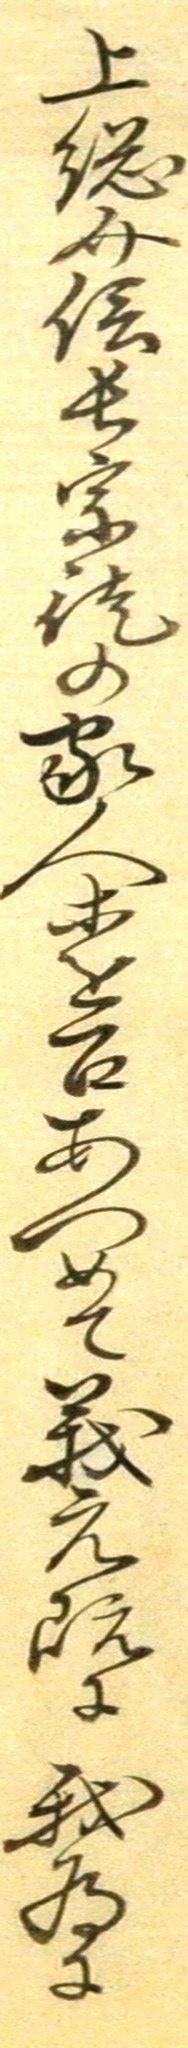上総介信長宗徒の家人等を召あつめて義元既に我為に
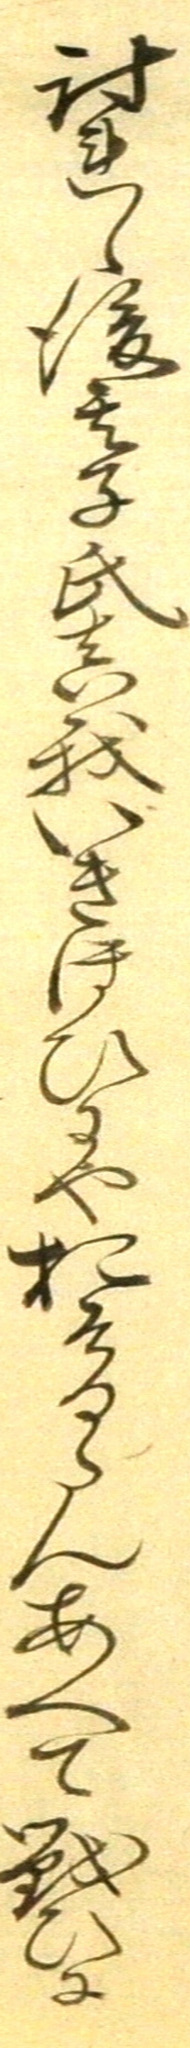討れし後其子氏真我いきほひにやおそるらんあへて戦ひに
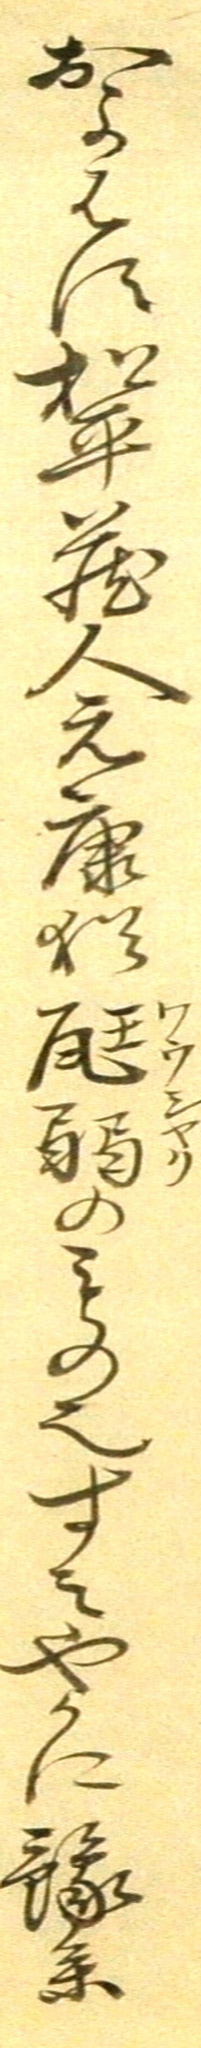およはす松平蔵人元康猶尩弱のもの也すみやかに予参
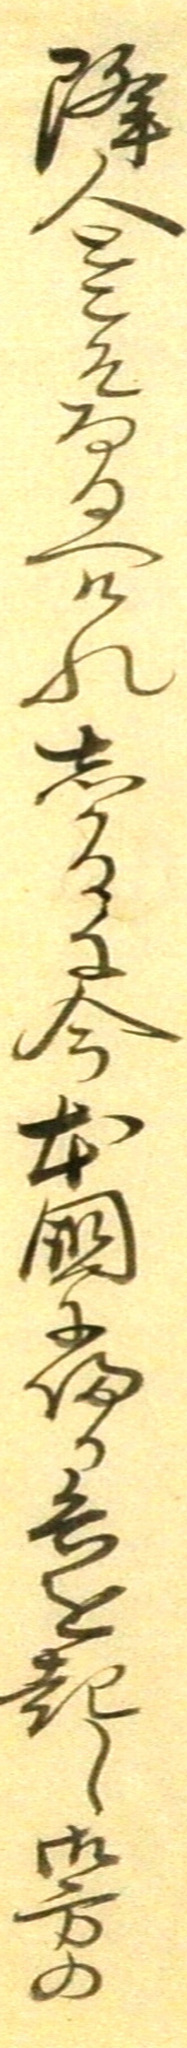降人とこそなるへけれしかるに今本国に帰り兵を起し御方の
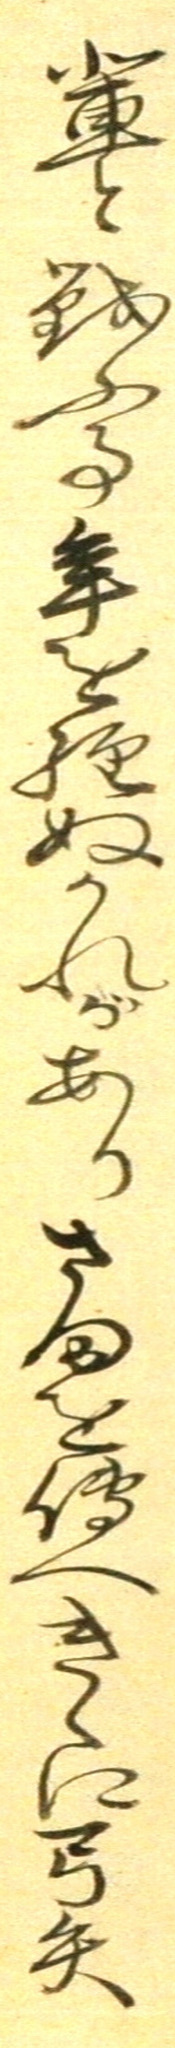輩と戦ふ事年を経ぬかれがありさまを伝へきくに弓矢
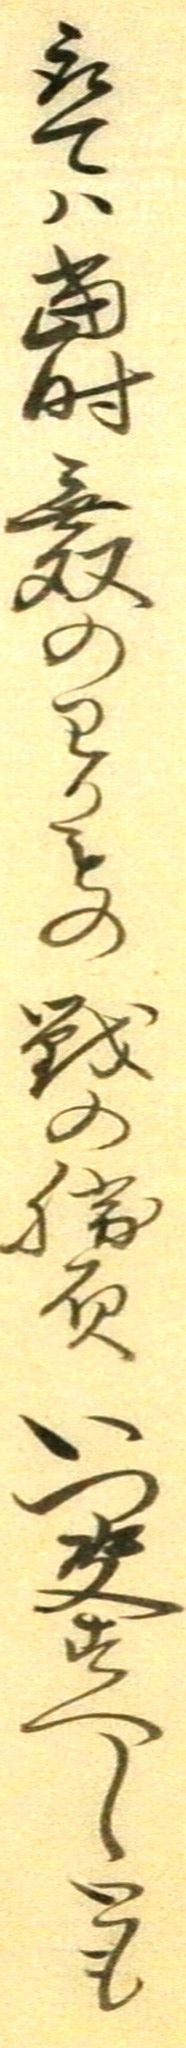取ては当時無双のわかもの戦の勝負いつ決すへしとも
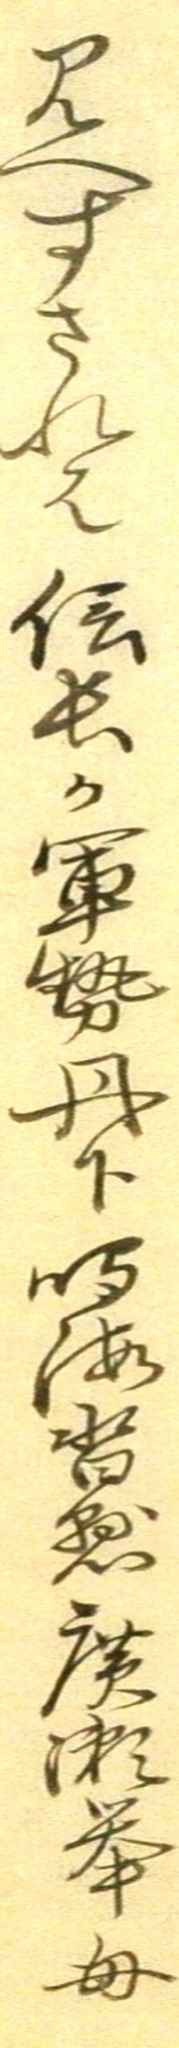見へすされは信長か軍勢丹下鳴海沓懸広瀬挙母
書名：藩翰譜（五）
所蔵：伊那市立高遠町図書館・合同会社AMANE
